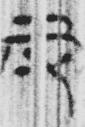反
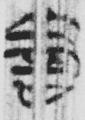善
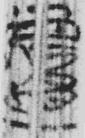○（復）
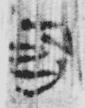○（始）
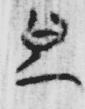也
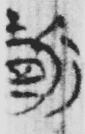○（慎）
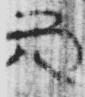亓（其）
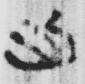出
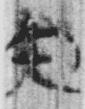內（入）
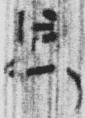也
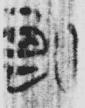訓（順）
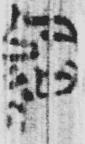绐（始）
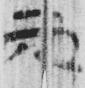亓（其）
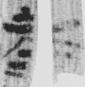惪（德）
